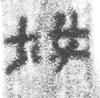戔
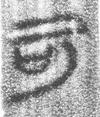可
